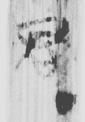君
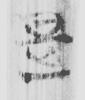是
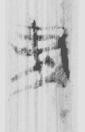𦘔
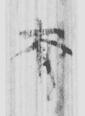夫
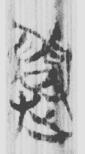{興止}
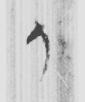人
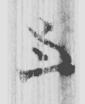之
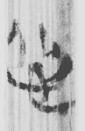{化心}
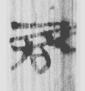者
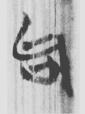句
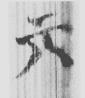亓
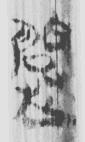{興止}
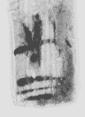{卅三}
